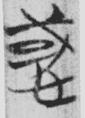惑
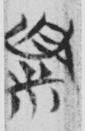頪（類）
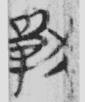獸
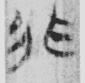非
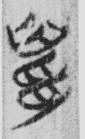鼠
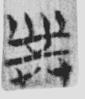{丵廾}（察）
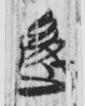後
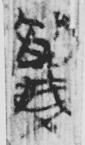{飤弗}（伺）
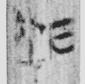昃（側）
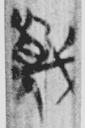蔑
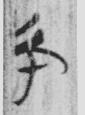○（師）
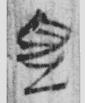見
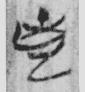鬯（殃）
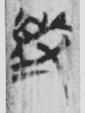毀
